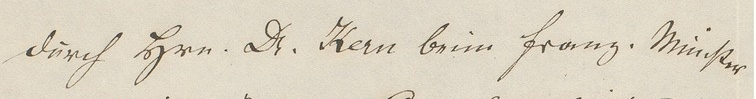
durch Hrn. Dr. Kern beim franz. Minister
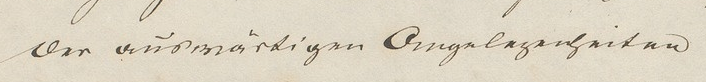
der auswärtigen Angelegenheiten
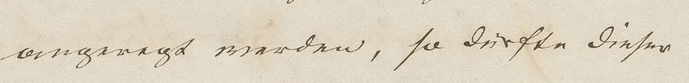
angeregt werden, so dürfte dieser
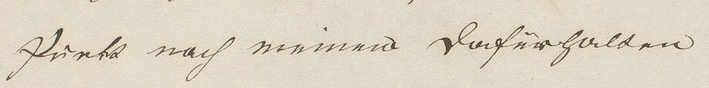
Punkt nach meinem Dafürhalten
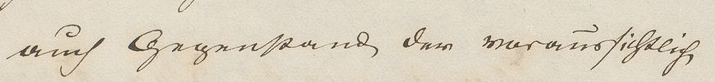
auch Gegenstand der voraussichtlich
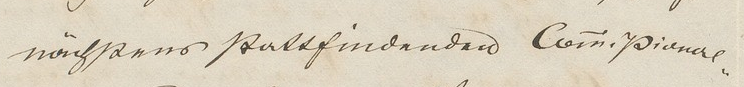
nächstens stattfindenden Commißional -
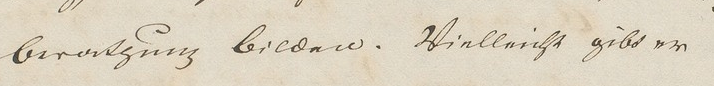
berathung bilden. Vielleicht gibt er
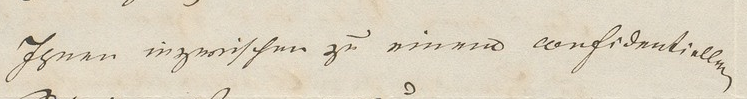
Ihnen inzwischen zu einem confidentiellen
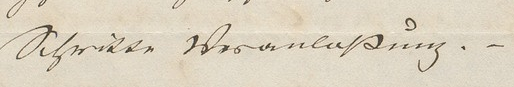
Schritte Veranlaßung. –
